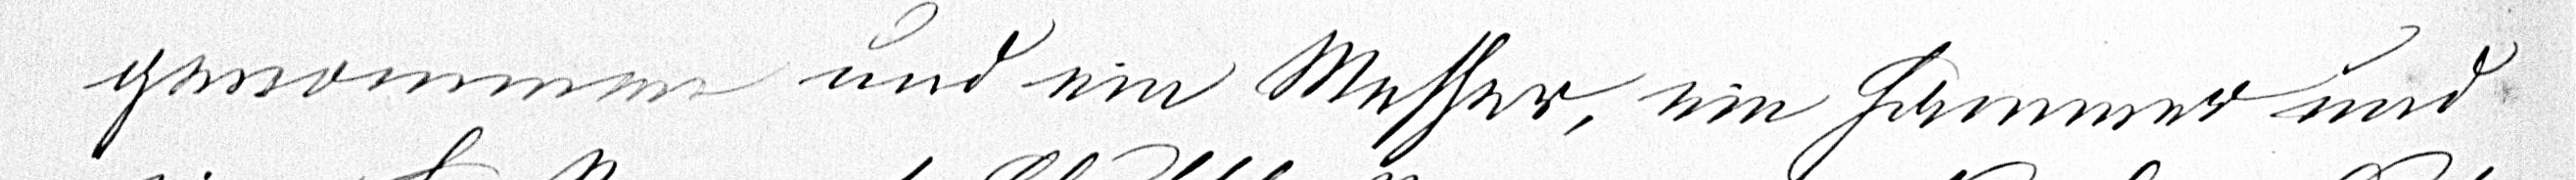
genommen und ein Messer, ein Hammer und
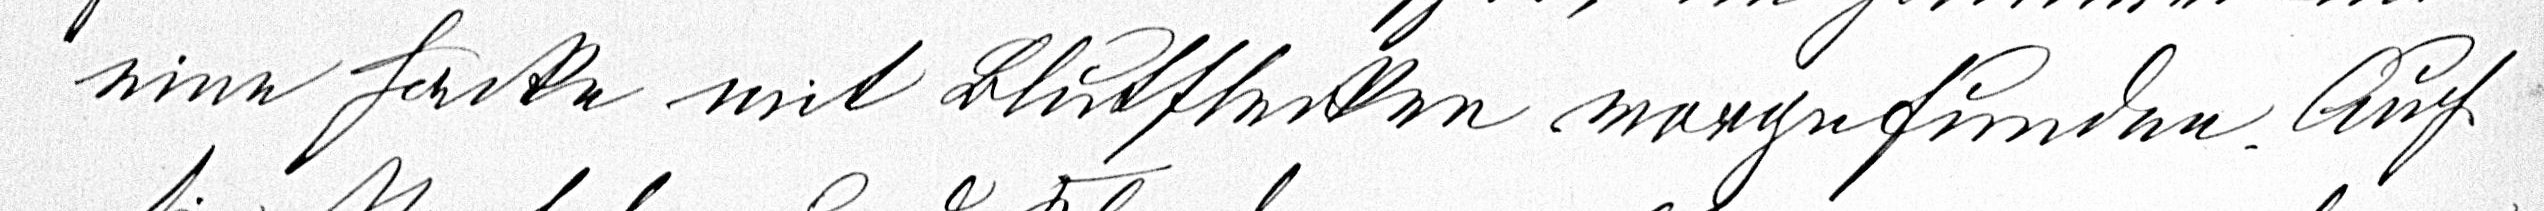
eine Hacke mit Blutflecken vorgefunden. Auch
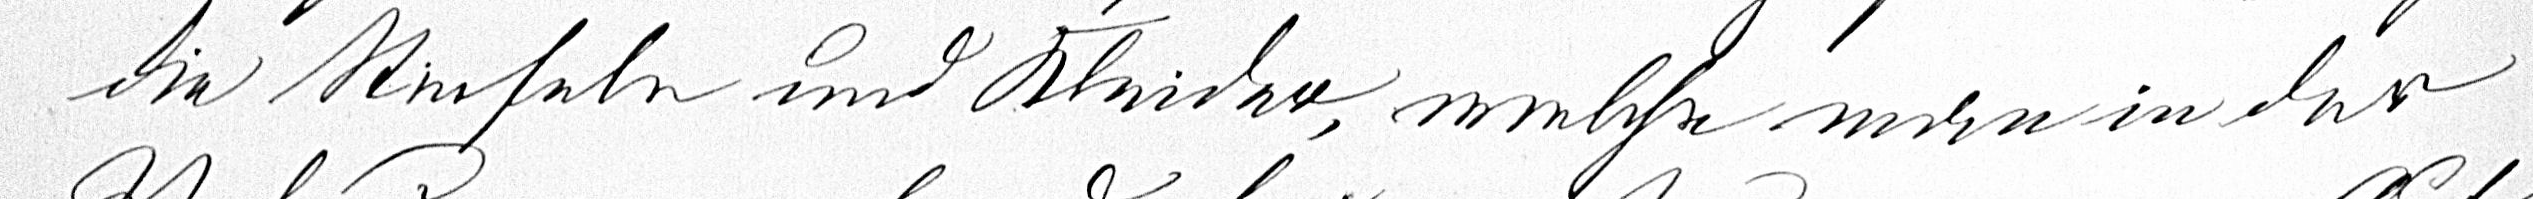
die Stieseln und Kleider, welche man in der
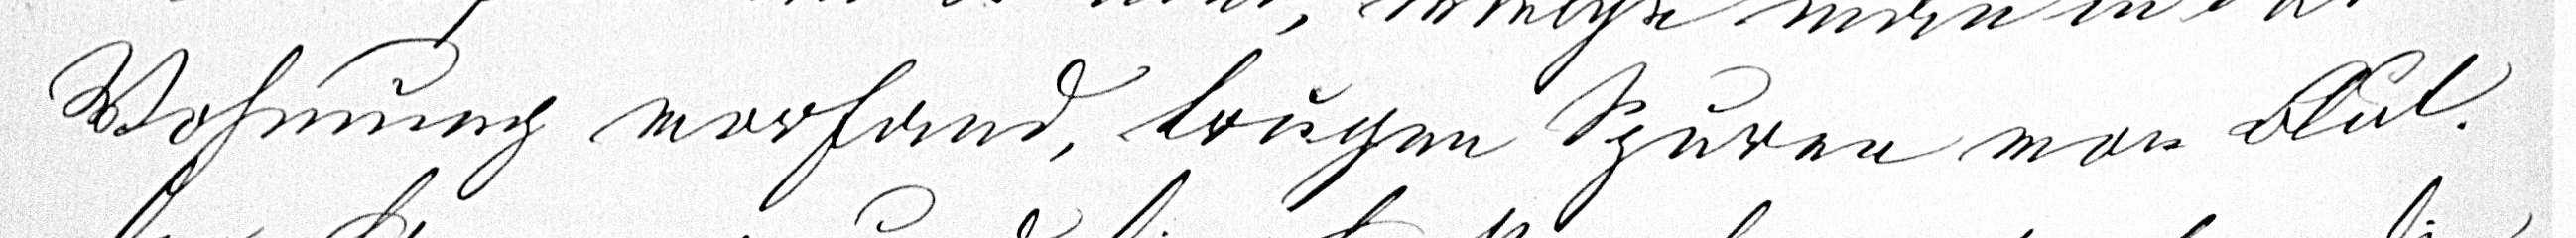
Wohnung vorfand, trugen Spuren mon Blut.
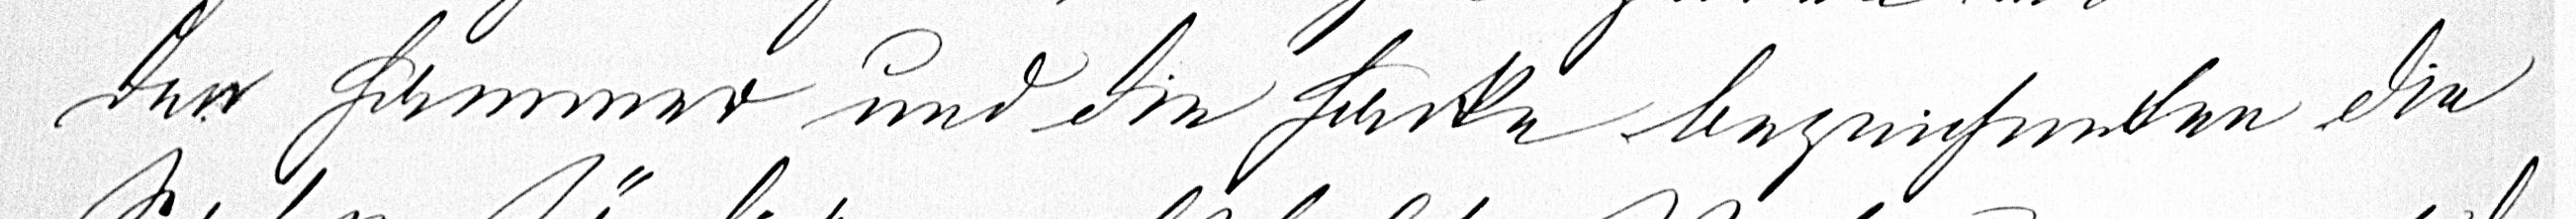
Der Hammer und die Hacke bezeichneten die
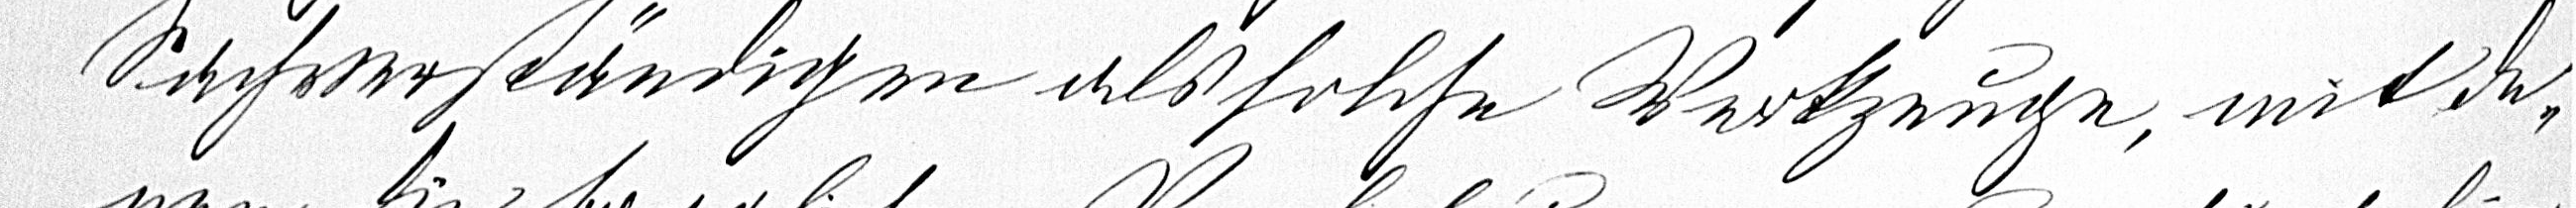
Sachverständigen als solche Werkzeuge, mit de¬
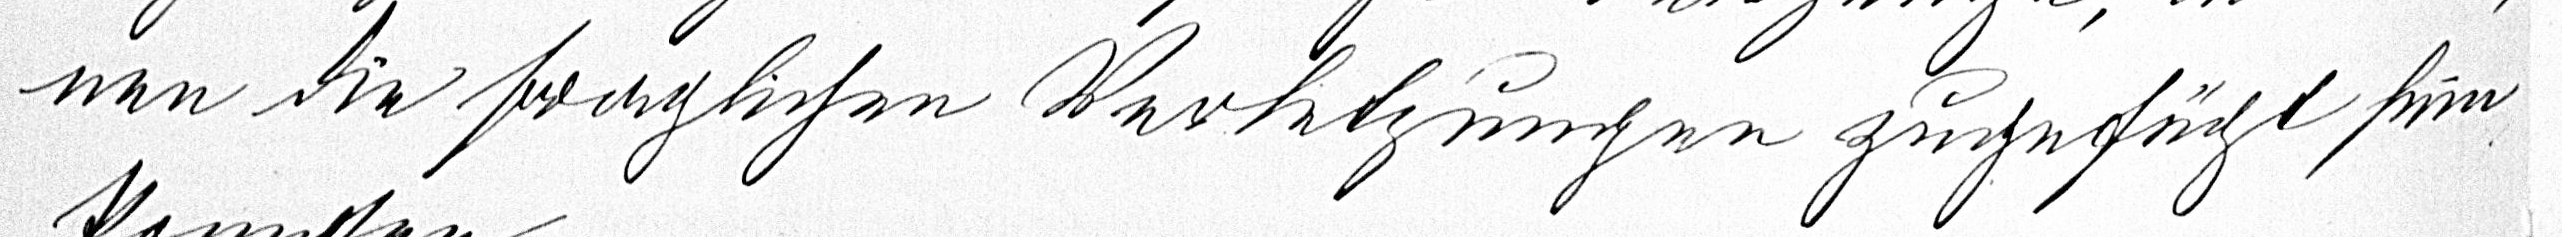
nen die fraglichen Verletzungen zugefügt sein
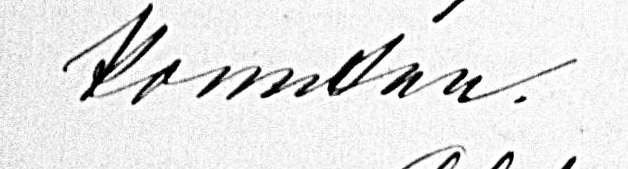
konnten.
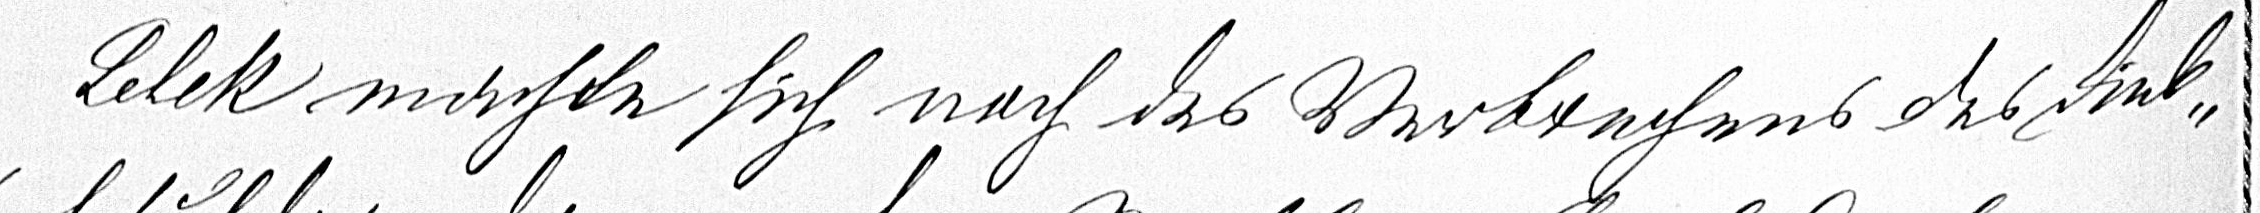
Lelek machte sich nach des Verbrechens des Dieb¬
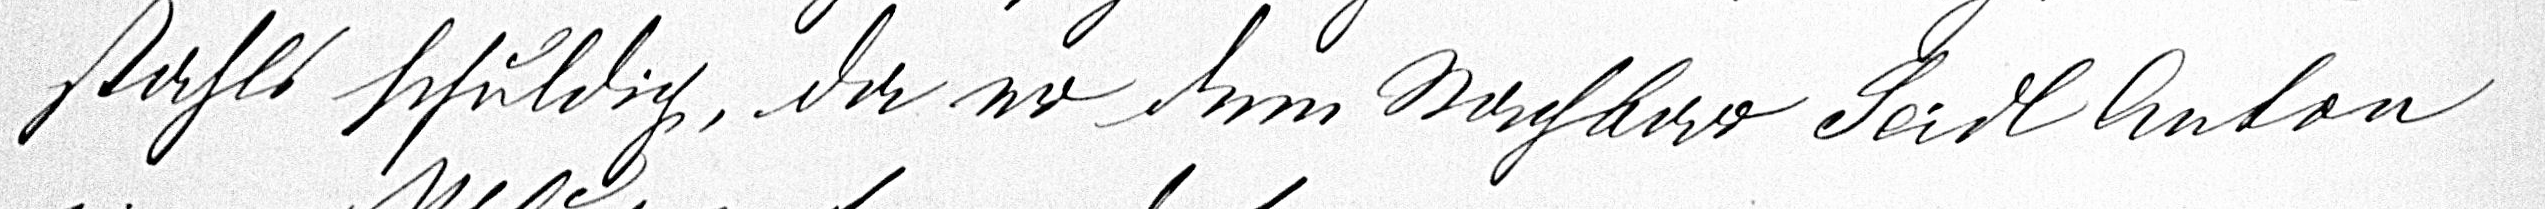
stahls schuldig, da er dem Nachbar Seidl Anton
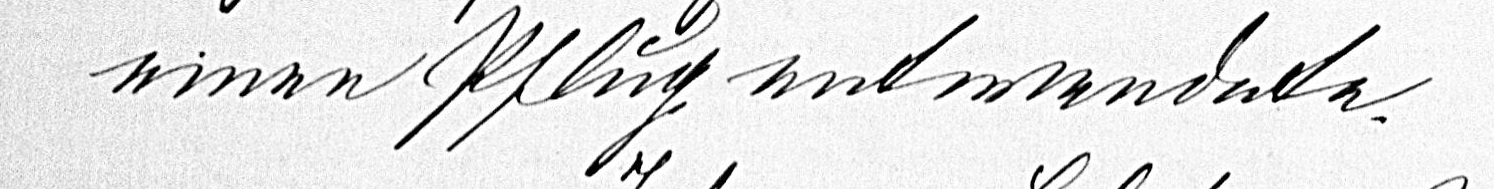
einen Pflug entwendete.
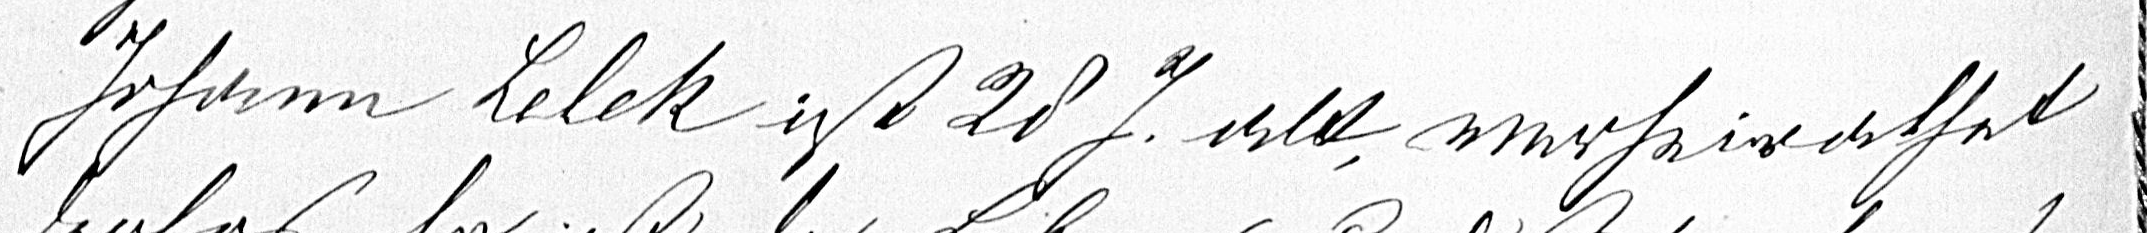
Johann Lelek ist 28 J. alt, verheirathet
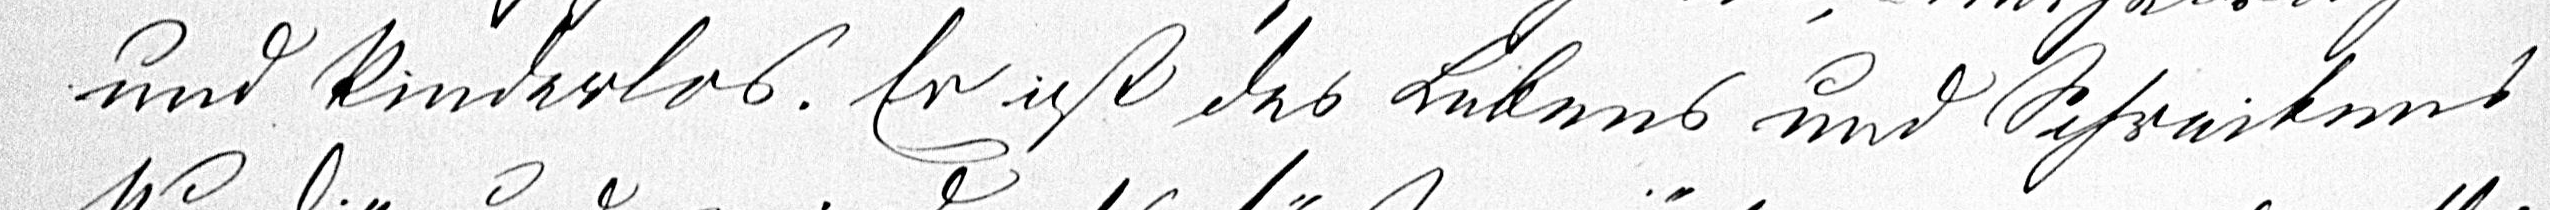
und kinderlos. Er ist des Lebens und Schreitens
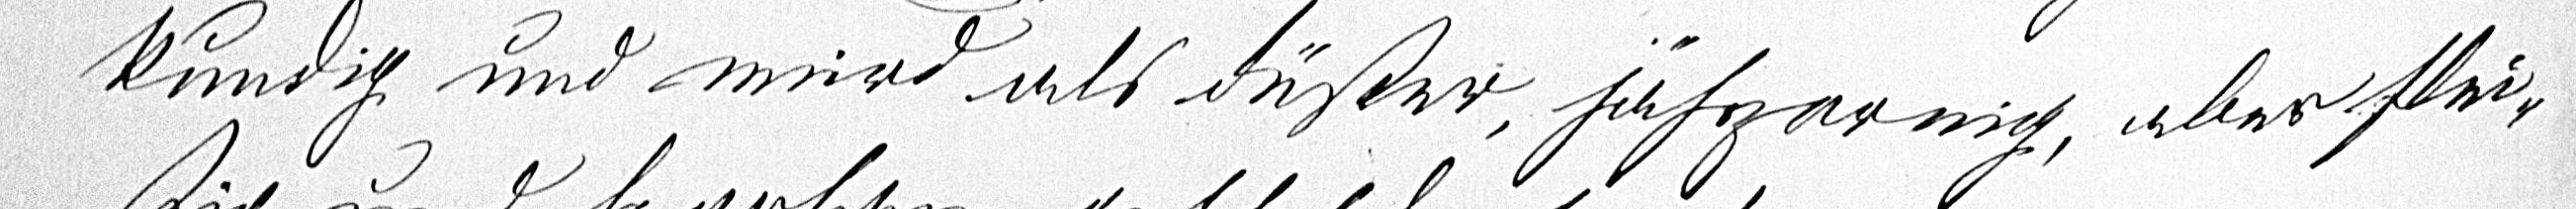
kundig und wird als düster, jährzornig, aber xx¬
